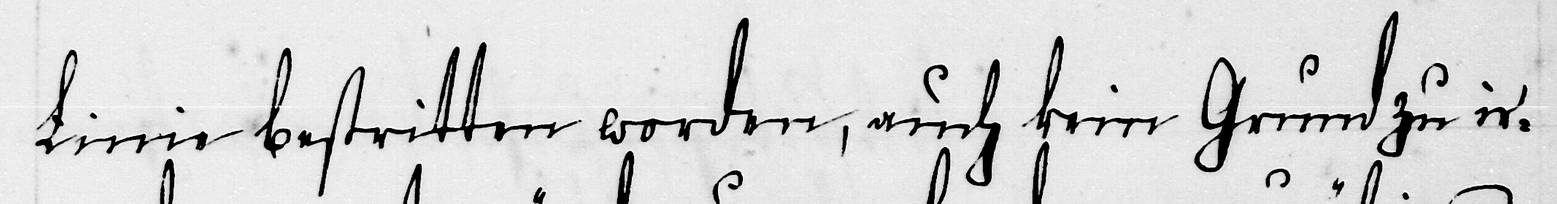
Linie bestritten worden, auch kein Grund zu ir¬
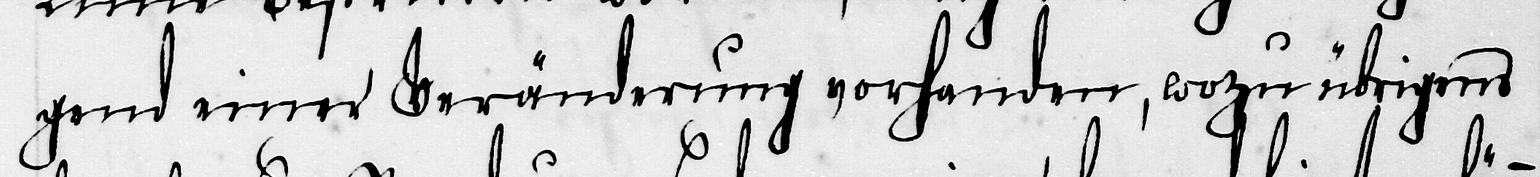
gend einer Veränderung vorhanden, wozu übrigens
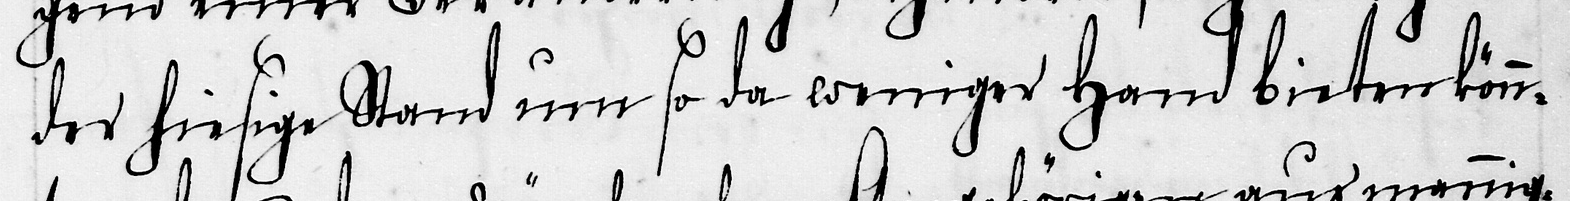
der hiesige Stand um so da weniger Hand bieten kön¬
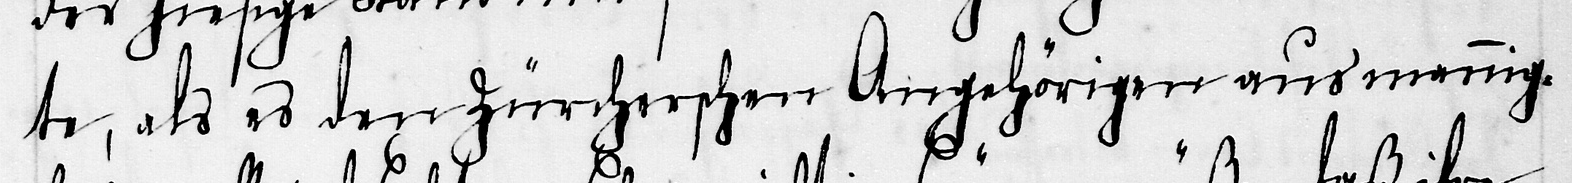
nte, als es den Zürcherschen Angehörigen aus mannig¬
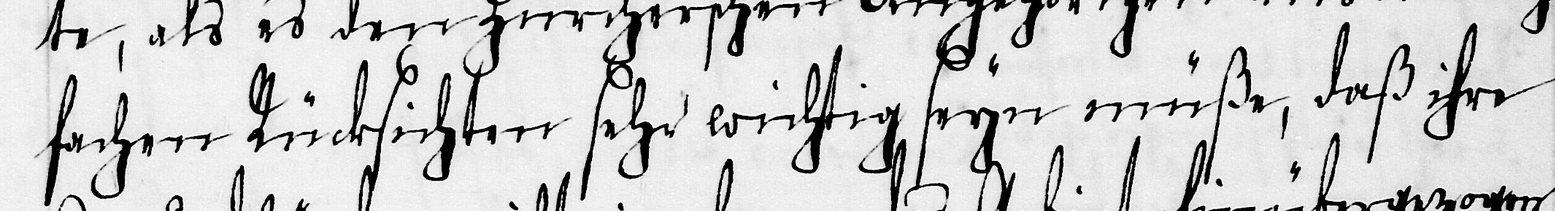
fachen Rücksichten sehr wichtig seyn müße, daß ihre
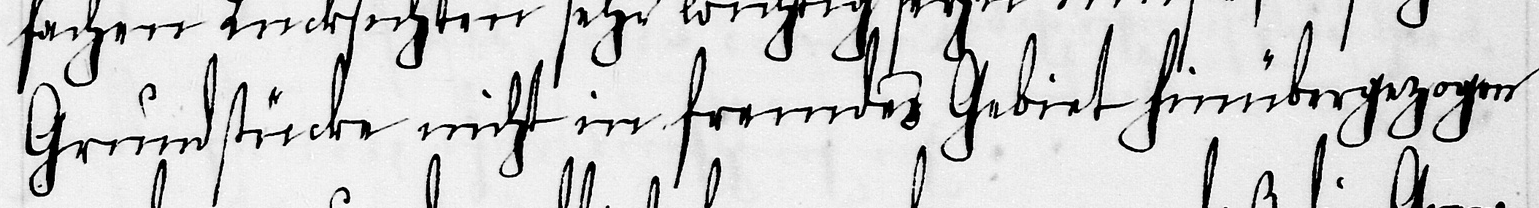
Grundstücke nicht in fremdes Gebiet hinübergezogen
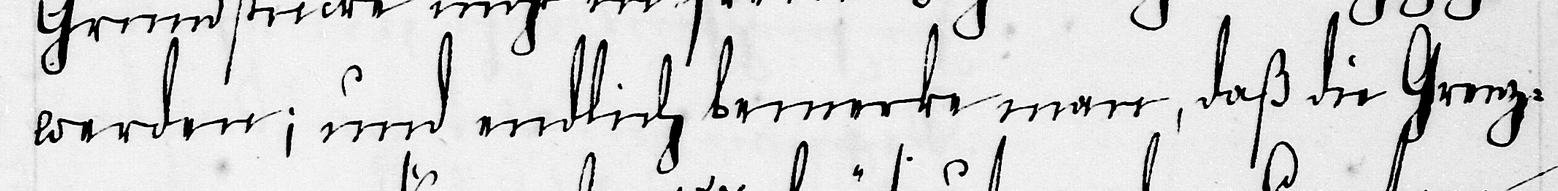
werden; und endlich bemerke man, daß die Grenz¬
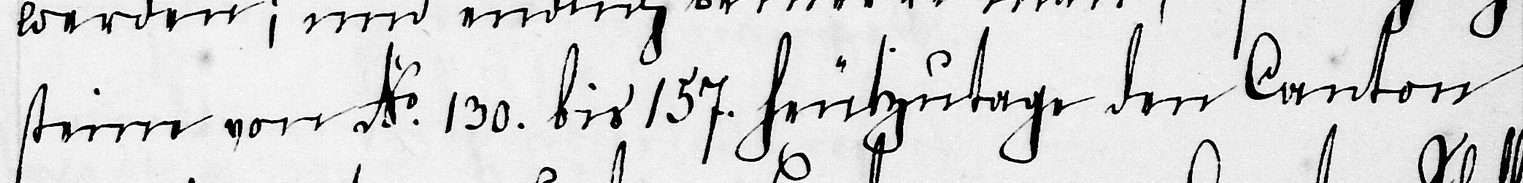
steine von No. 130. bis 157. heutzutage den Canton
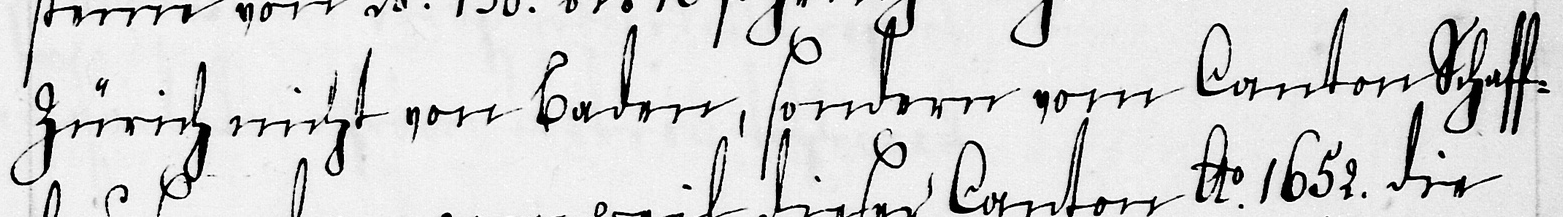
Zürich nicht von Baden, sondern vom Canton Schaf¬
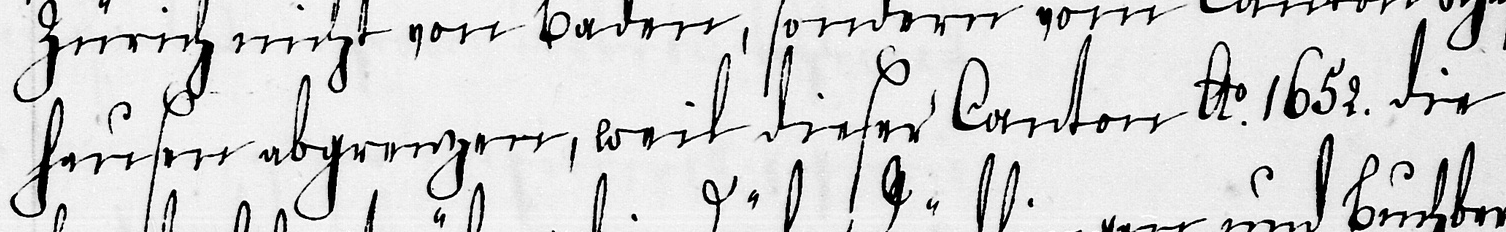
fhausen abgrenzen, weil dieser Canton Ao. 1652. die
